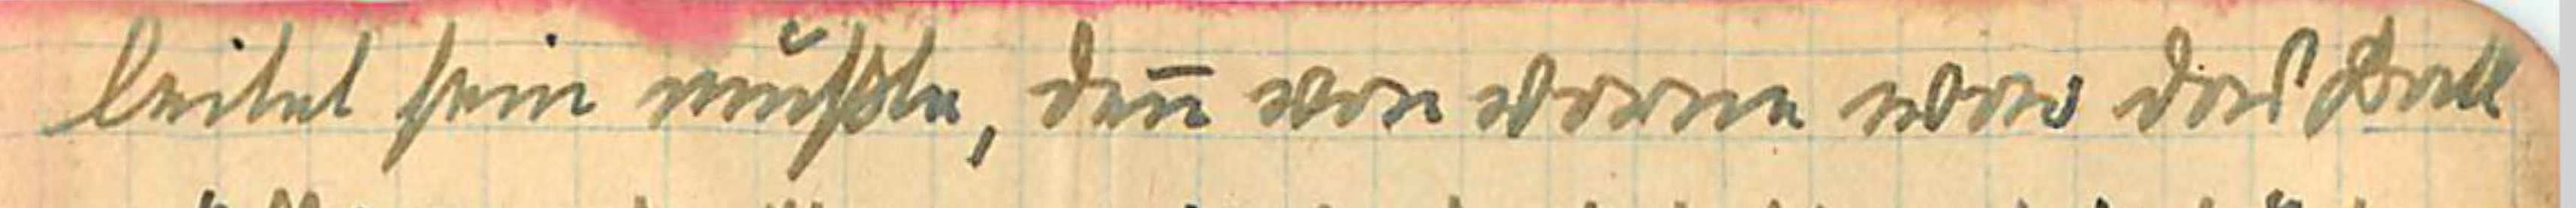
leitet sein mußte, denn von vorne war das Batl.
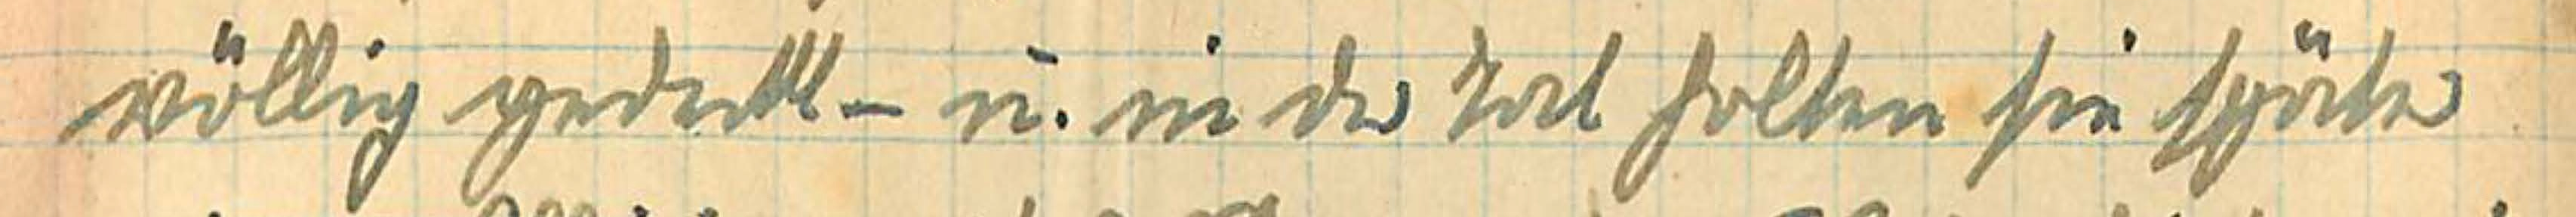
völlig gedeckt – u. in der Tat holten sie später
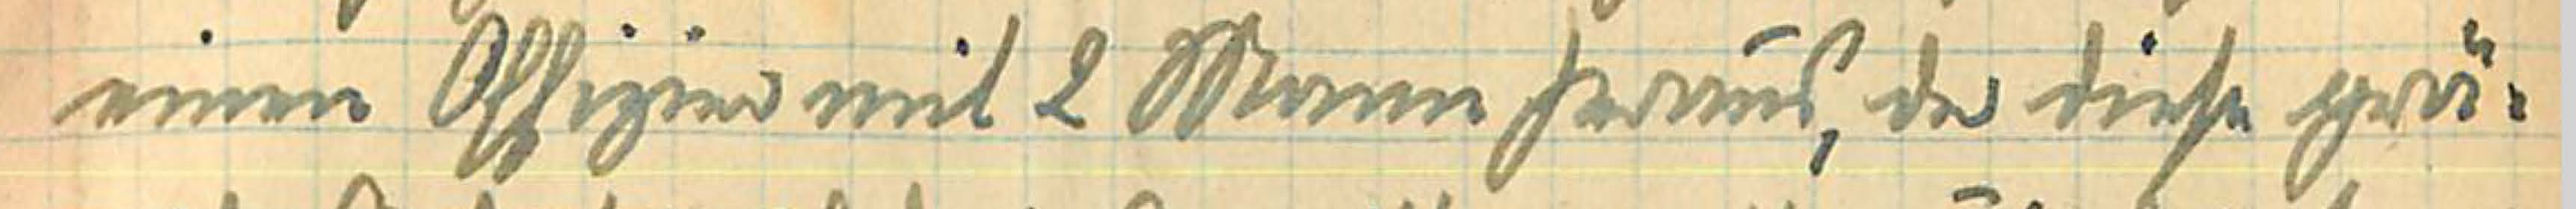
einen Offizier mit 2 Mann heraus, der diese prä-
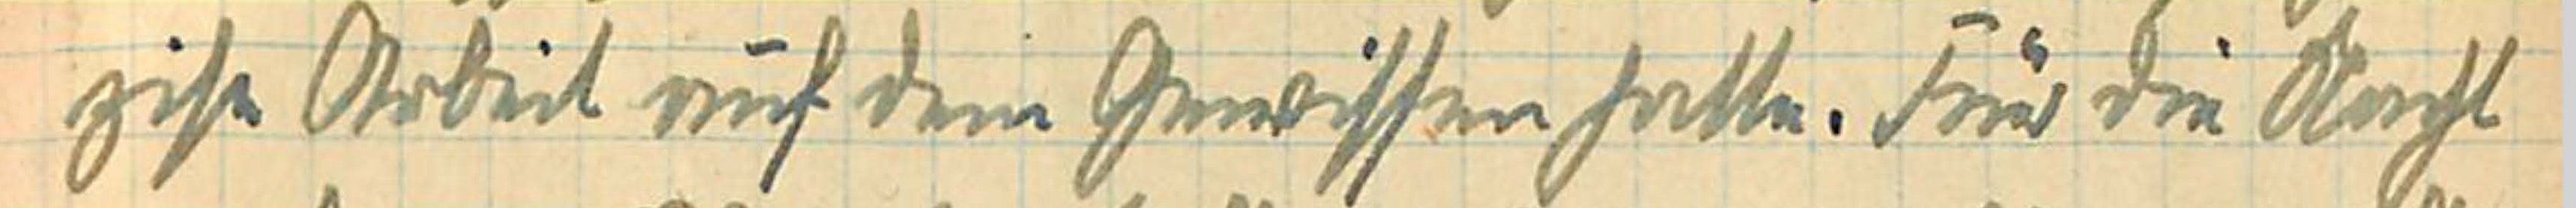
zise Arbeit auf dem Gewissen hatte. Für die Nacht
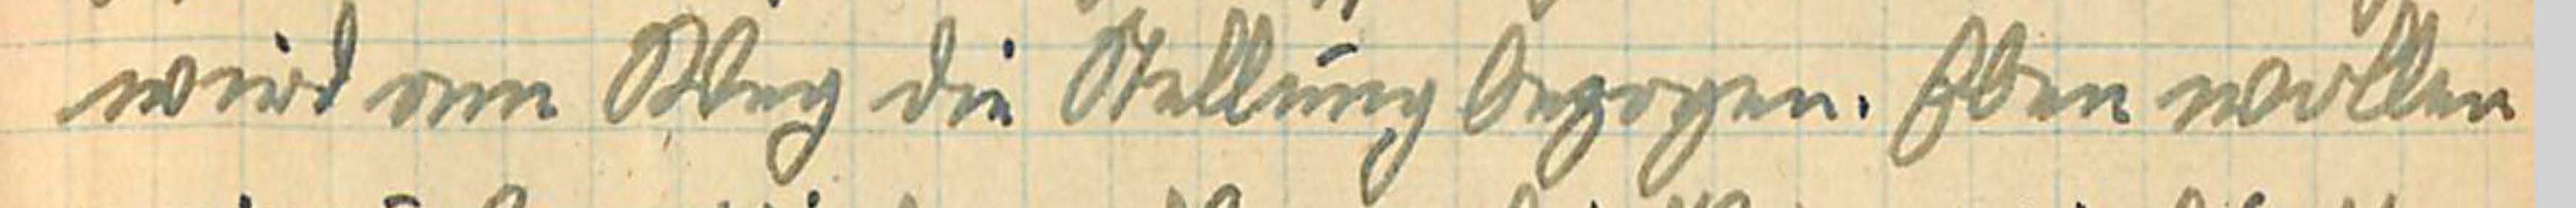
wird am Weg die Stellung bezogen. Eben wollen
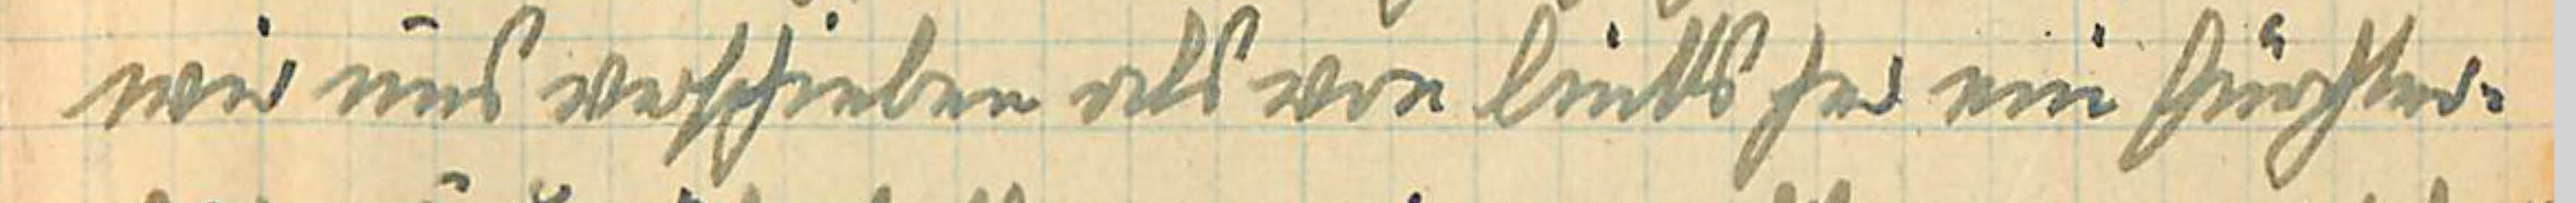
wir uns verschieben als von links her ein fürchter-
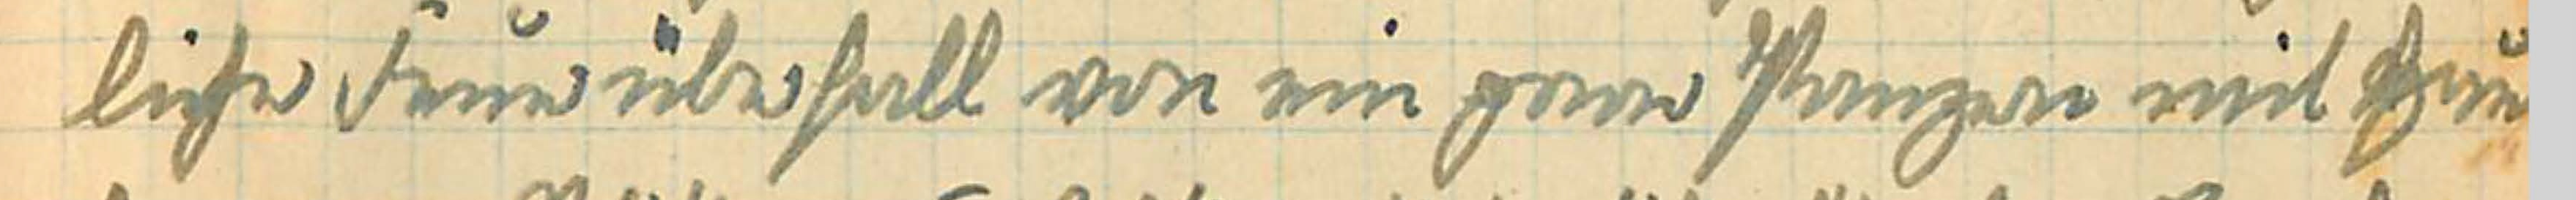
licher Feuerüberfall von ein paar Panzern mit Hau-
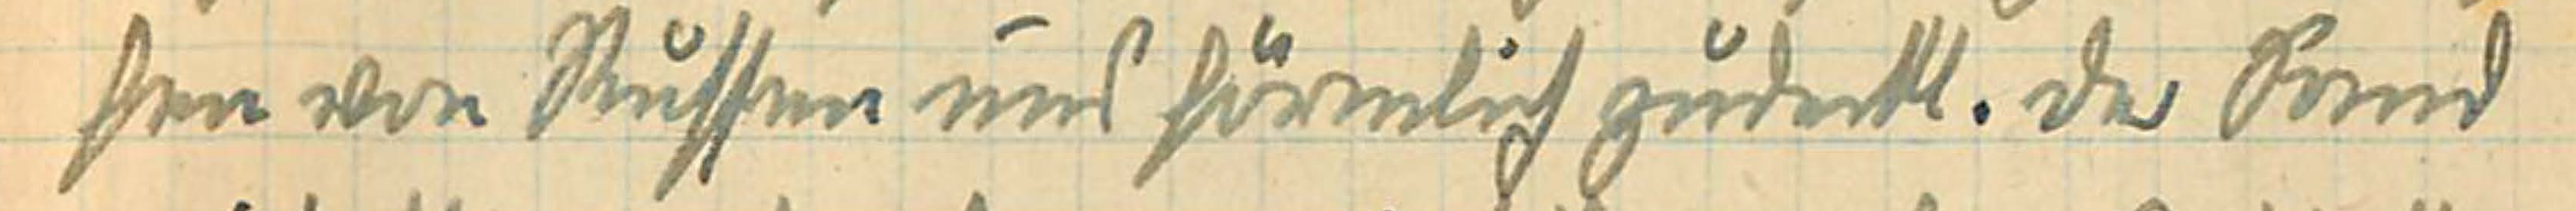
fen von Russen uns förmlich zudeckt. Der Sand
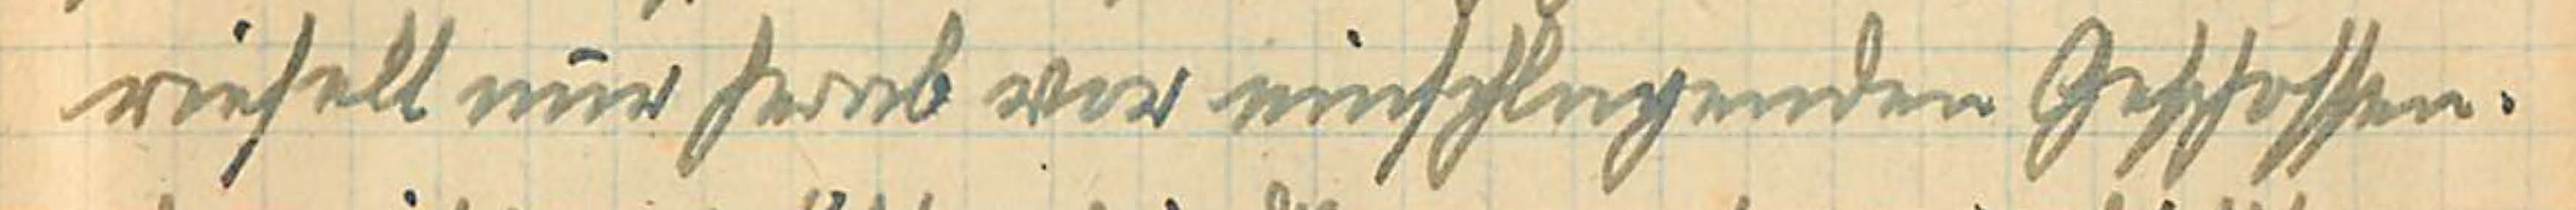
rieselt nur herab vor einschlagenden Geschossen.
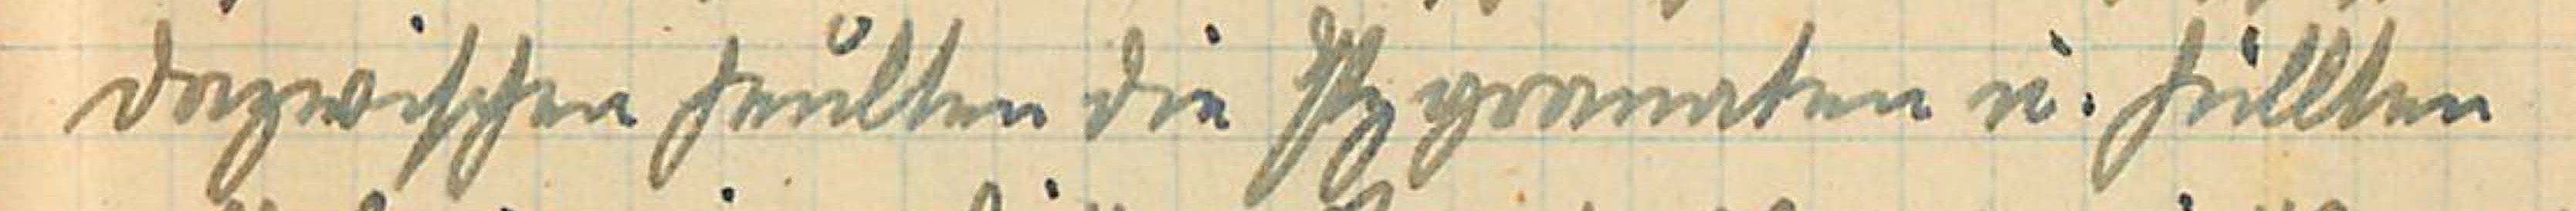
Dazwischen heulten die Pzgranaten u. hüllten
